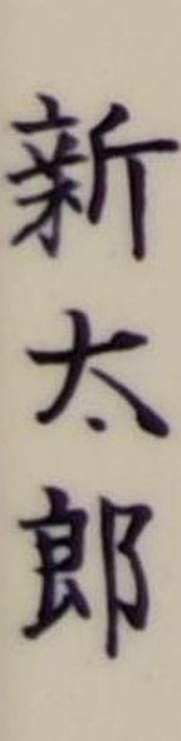新太郎

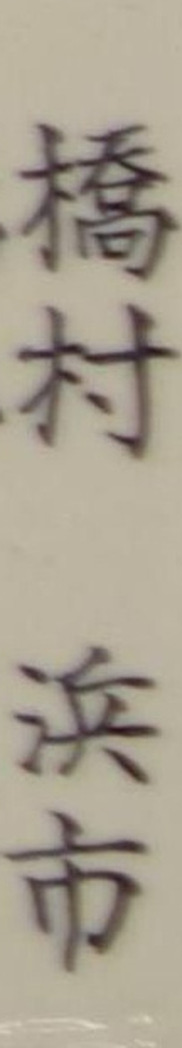橋村浜市
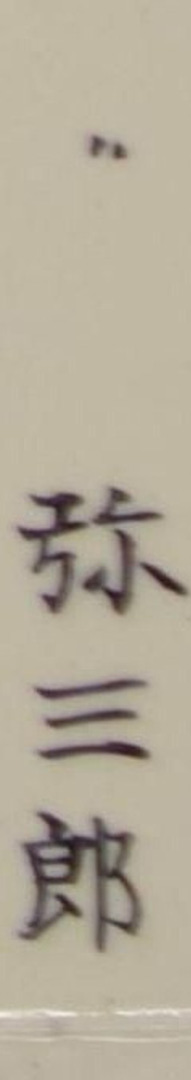弥三郎
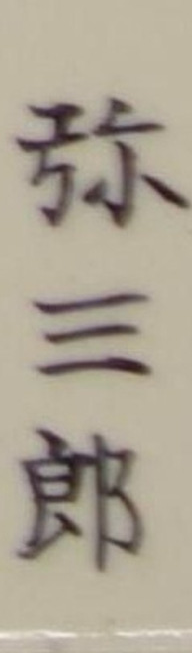弥三郎
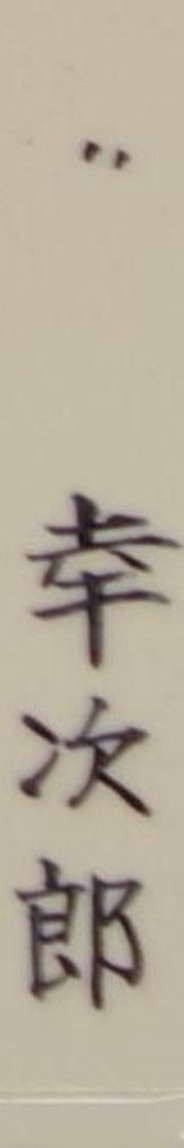幸次郎
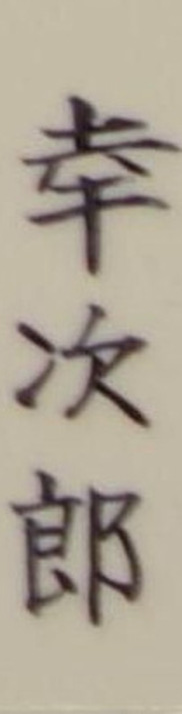幸次郎
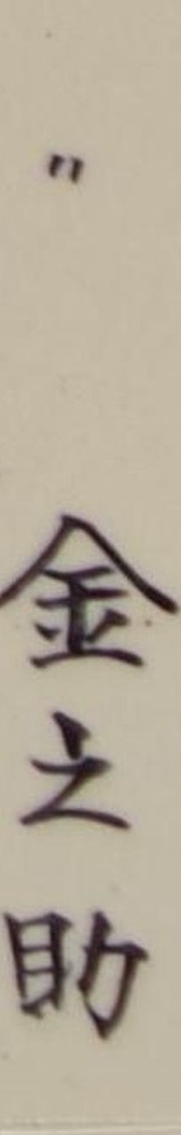金之助
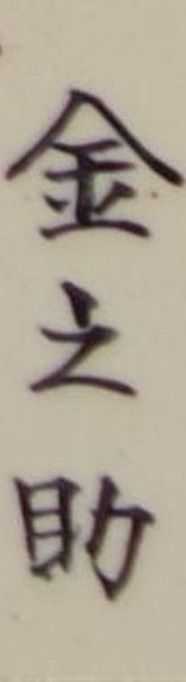金之助
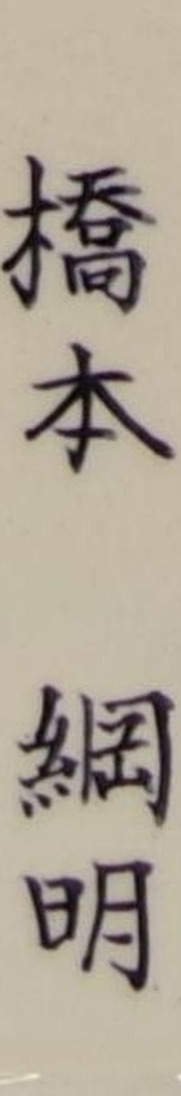橋本綱明
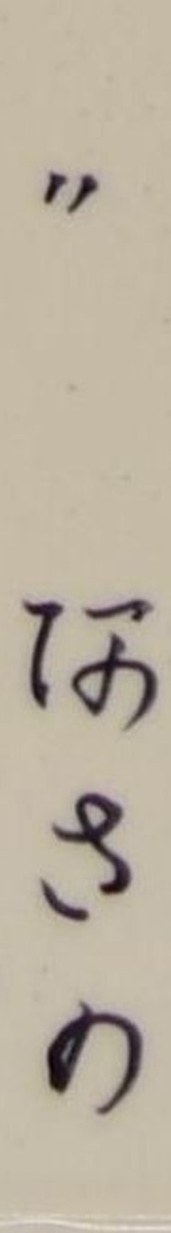あさの
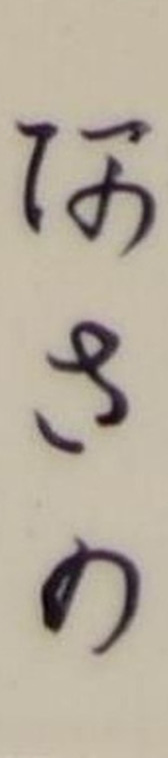あさの

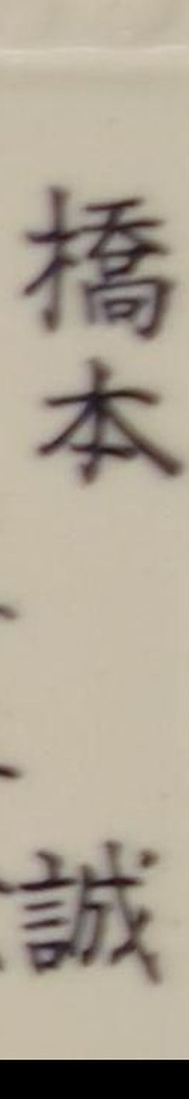橋本誠
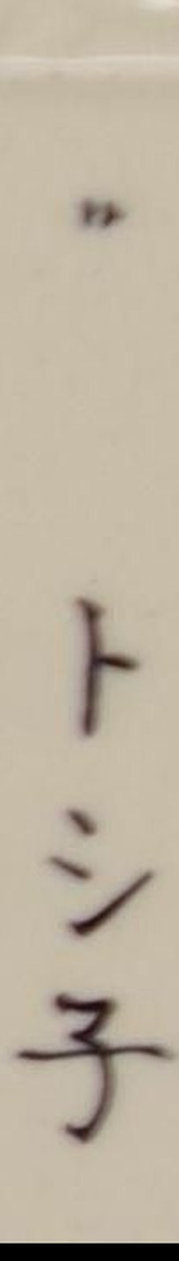トシ子
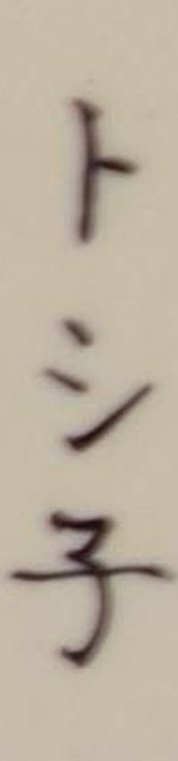トシ子
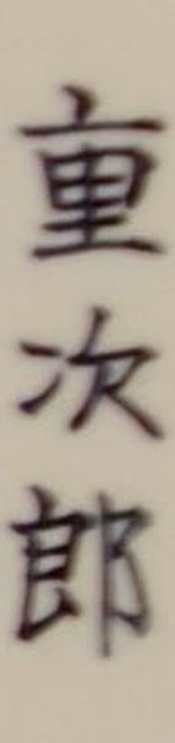重次郎
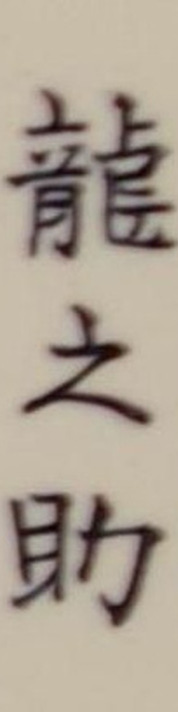龍之助
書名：M~S
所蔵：高野山金剛峯寺
